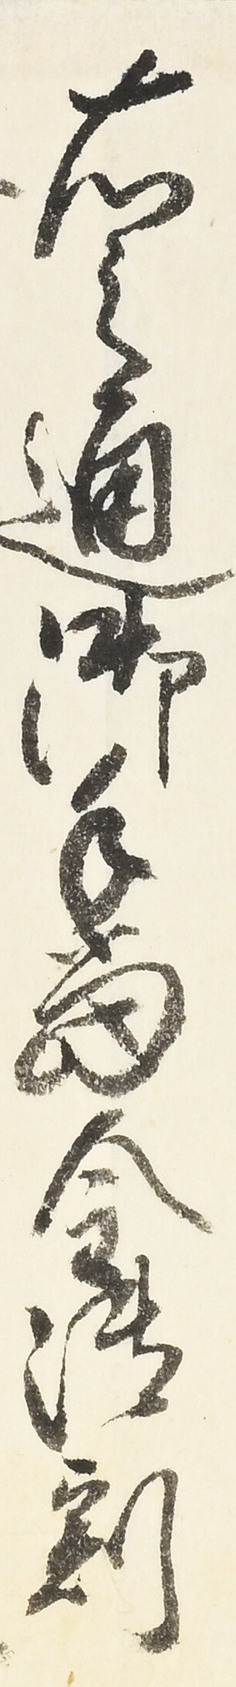右之通御手当金御割
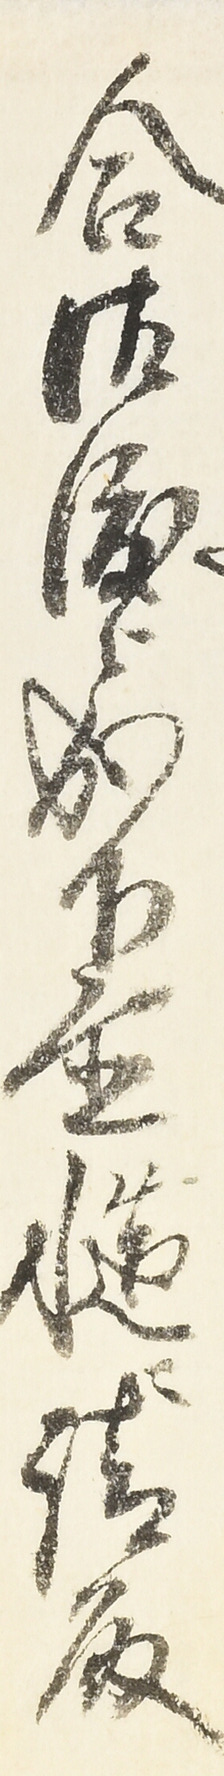合御渡被成下置慥ニ請取
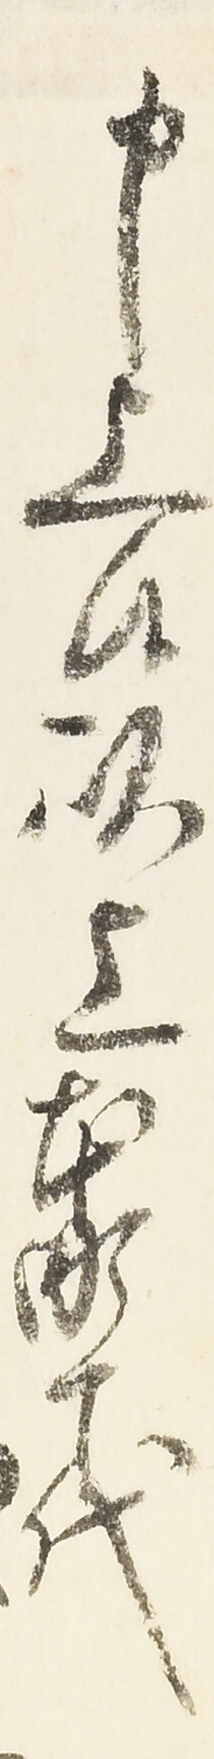申上候以上本町丁代
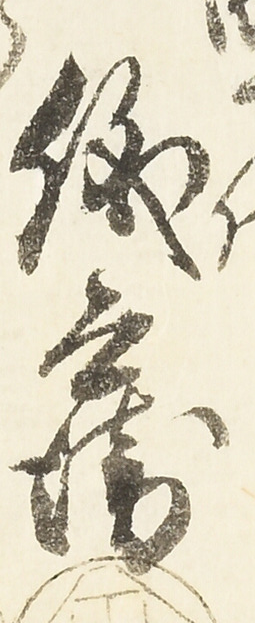辰儀兵衛
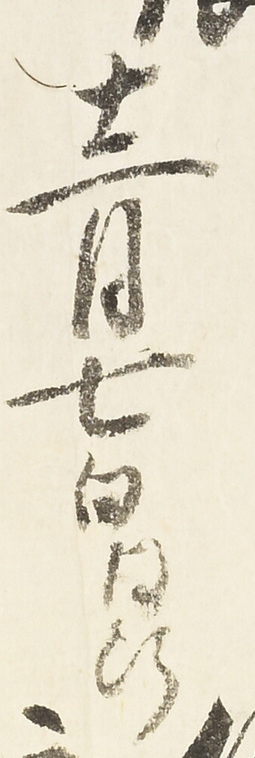十二月七日同断
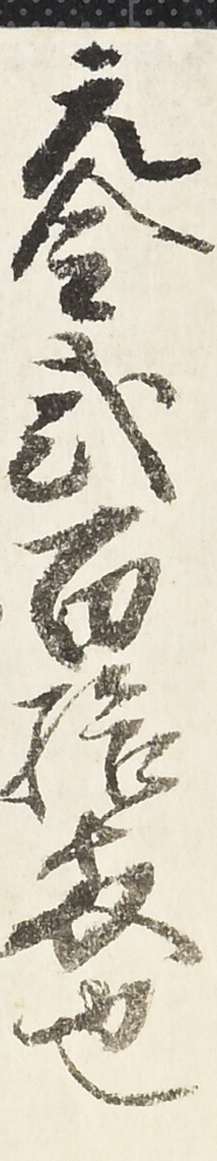元金弐百拾両也
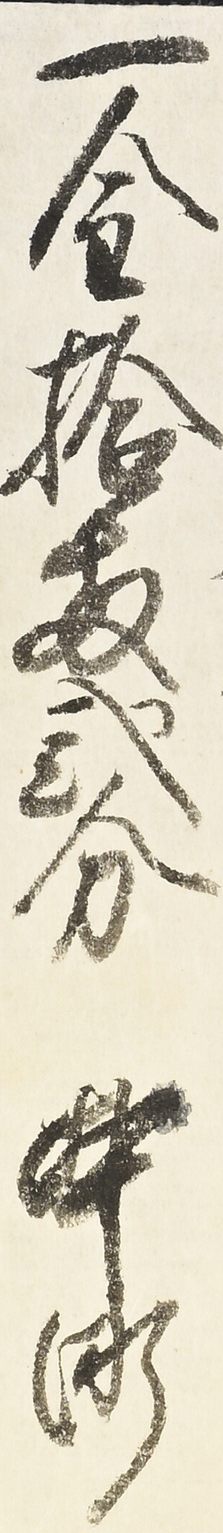一金拾両弐分中町
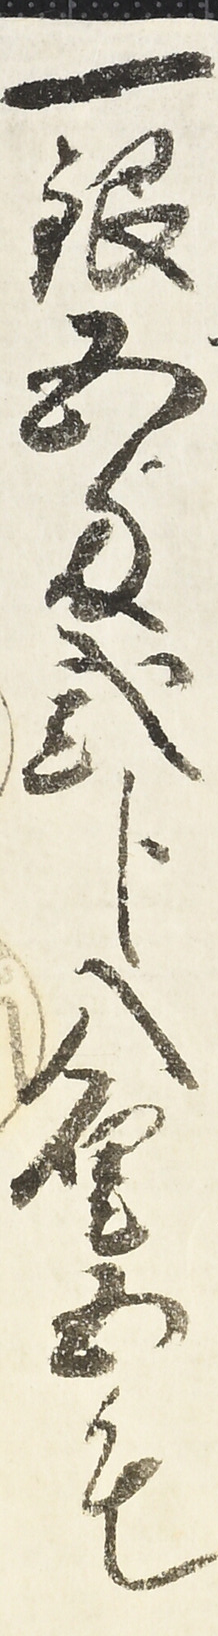一銀五匁弐分八厘五毛
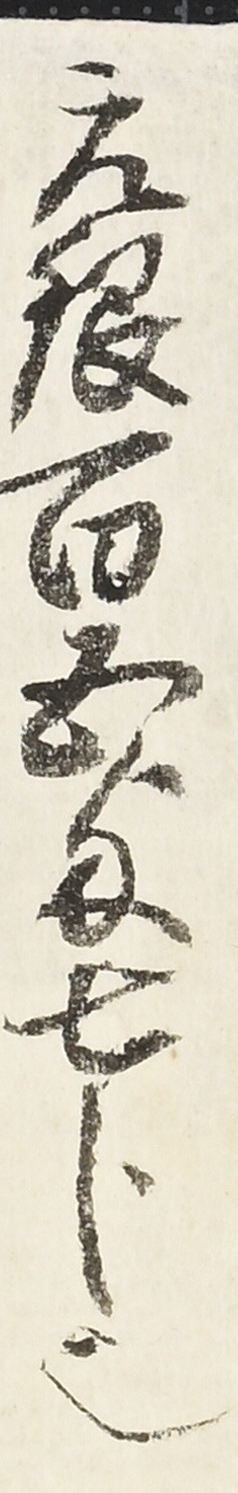元銀百五匁七分也
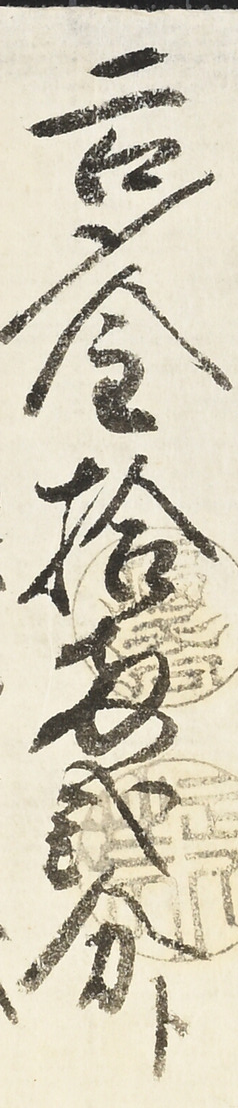二口〆金拾両弐分ト
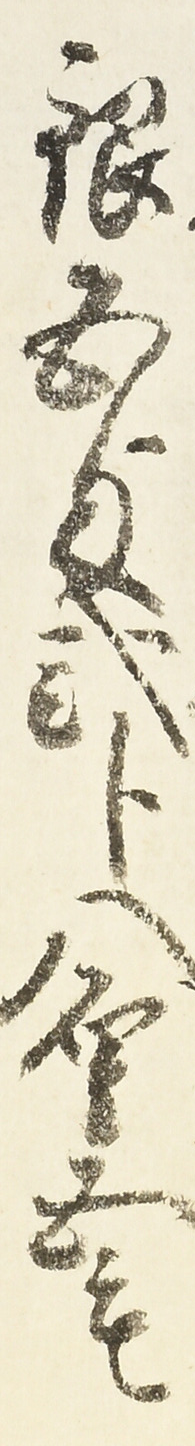銀五匁弐分八厘五毛
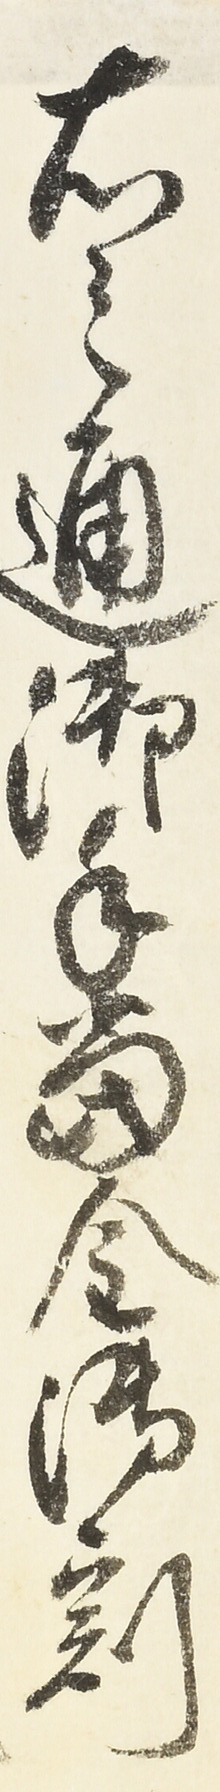右之通御手当金御割
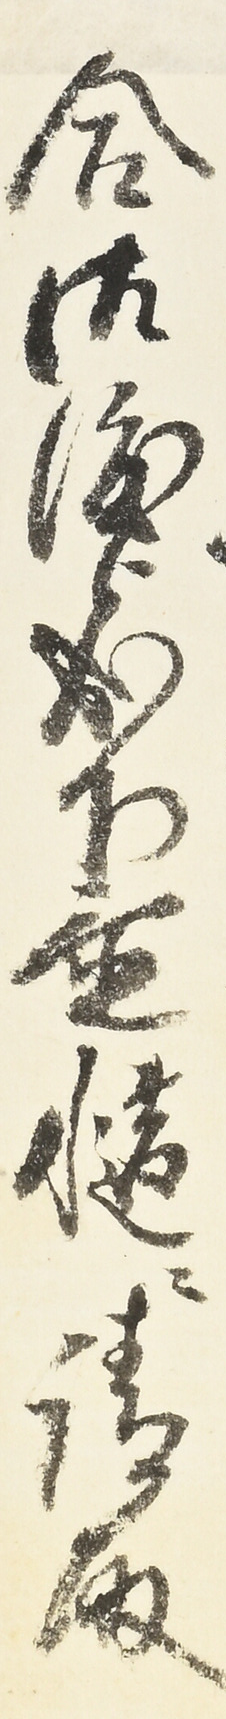合御渡被成下置慥ニ請取
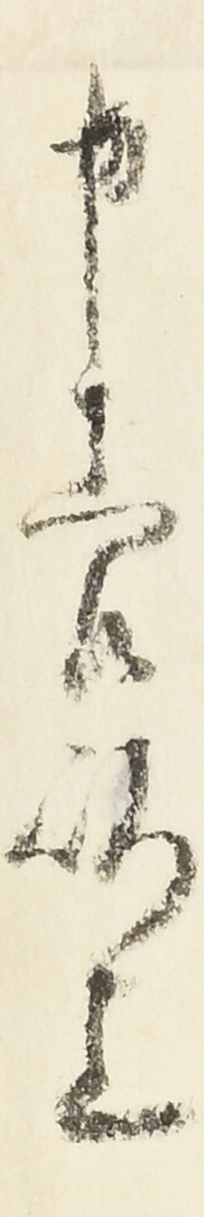申上候以上
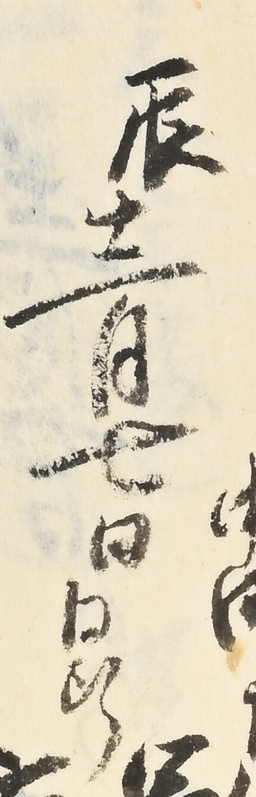十二月七日同断

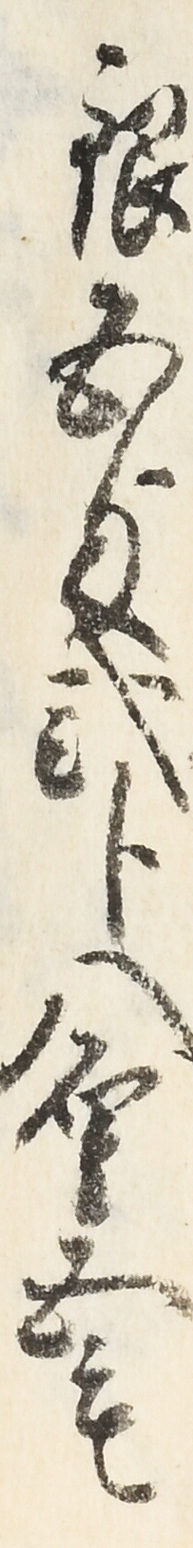銀五匁五分弐厘五毛
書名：御才覚金御利足割渡扣帳
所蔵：伊那市立高遠町図書館・合同会社AMANE
